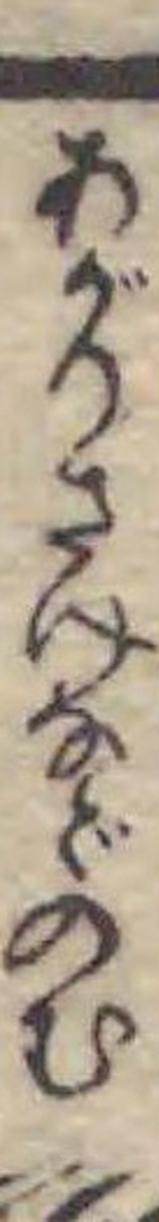あがりさけなどのむ
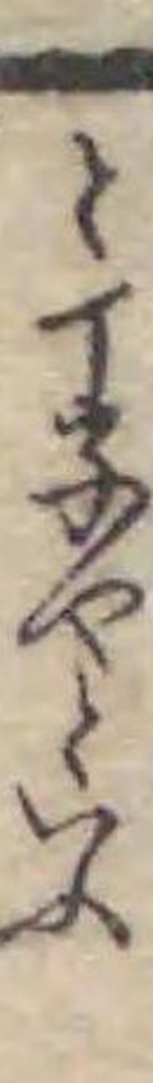と丁子やといふ
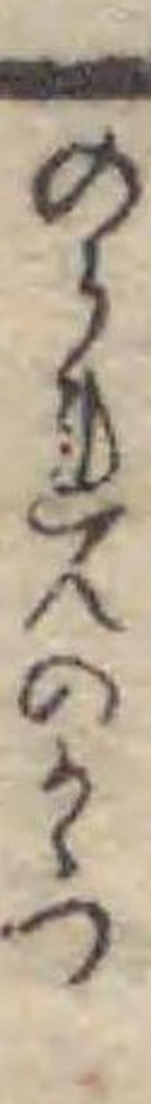のうれんのかゝつ
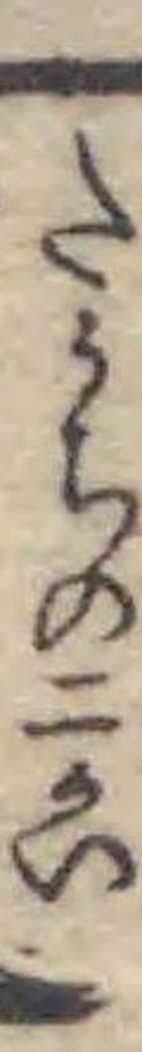たうちの二かい
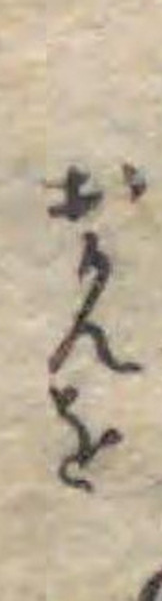おかんを
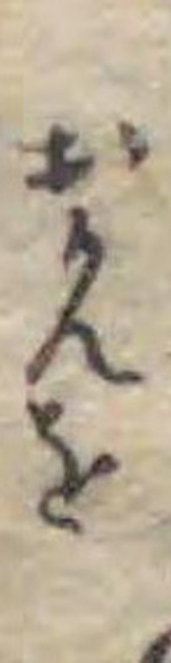おかんを
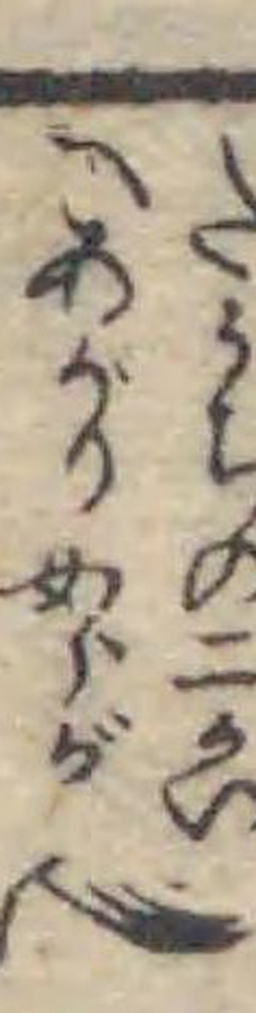へあがり女郎が
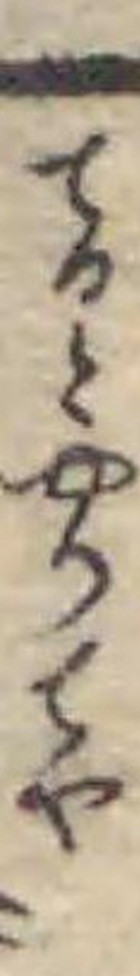てるとやりてや
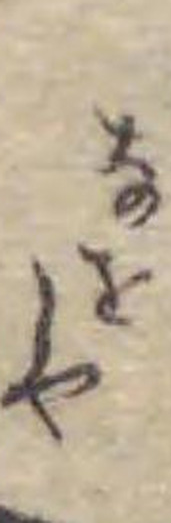なをしや
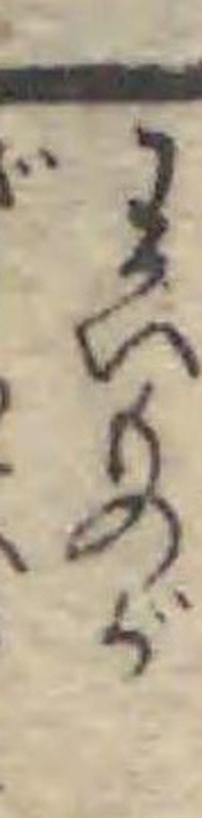わかいものが
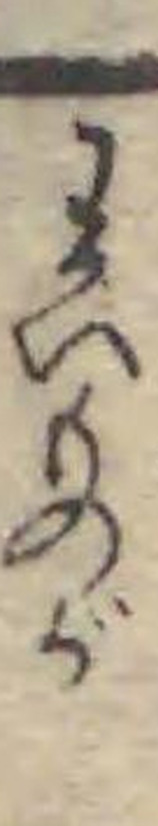わかいものが
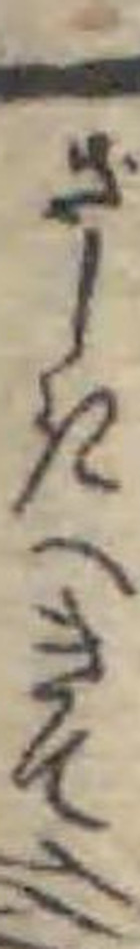ざしきへきて
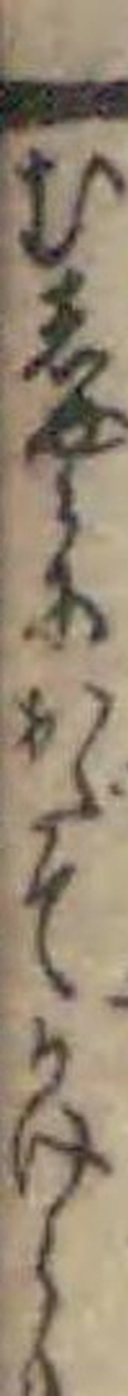むしやうにおだてかけられ
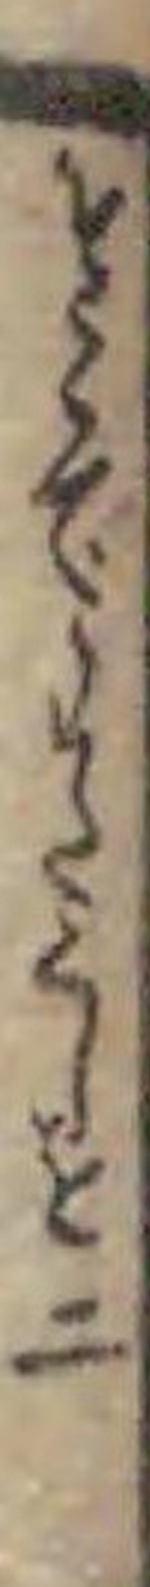そこでわたくしを二
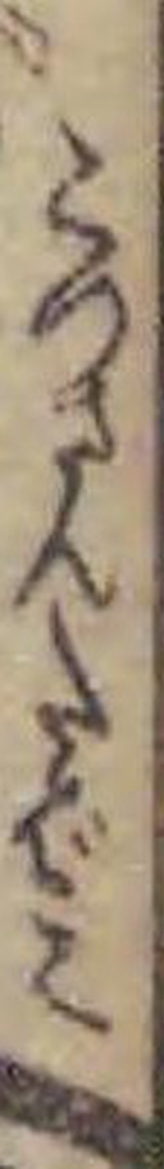たつさんたばこ
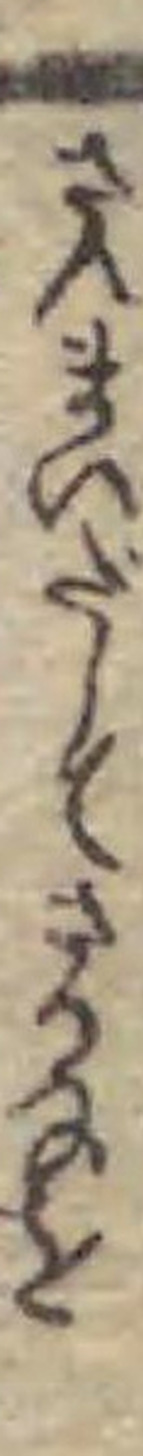さんまいだしてさかなを
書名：紙屑身上噺 : 3巻
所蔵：国立国会図書館 National Diet Library, JAPAN
